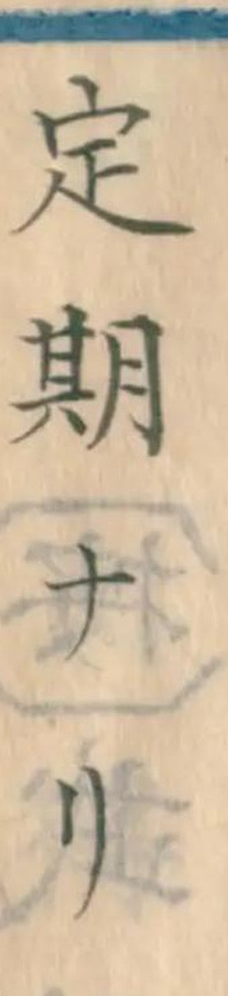定期ナリ

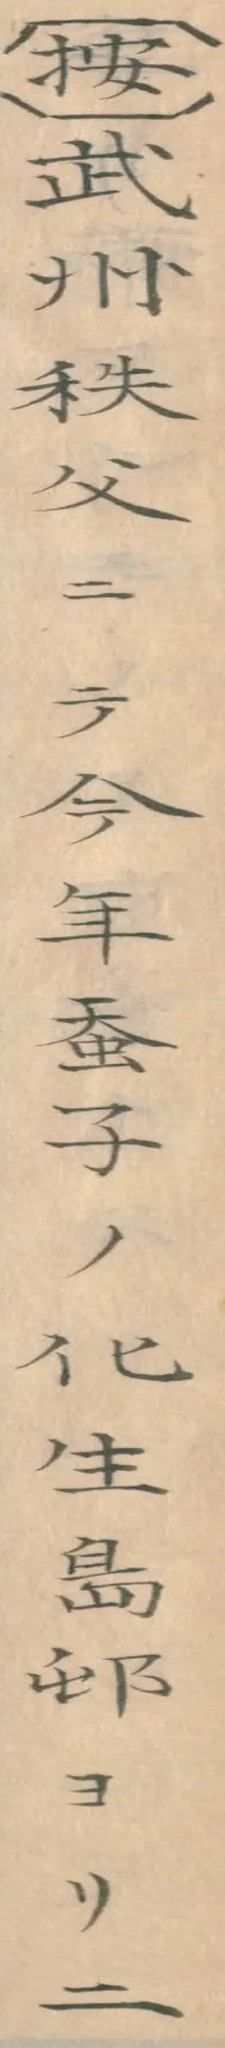[按]武州秩父ニテ今年蚕子ノ化生島邨ヨリ二
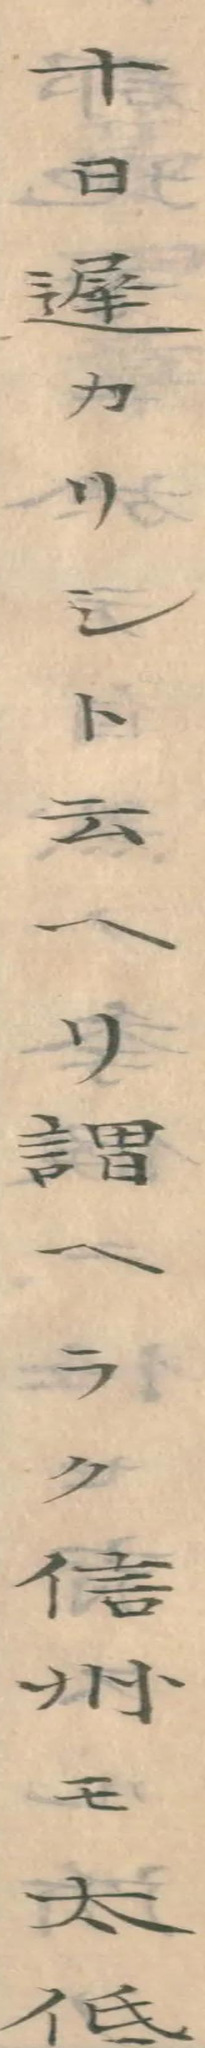十日遅カリシト云ヘリ謂ヘラク信州モ太低
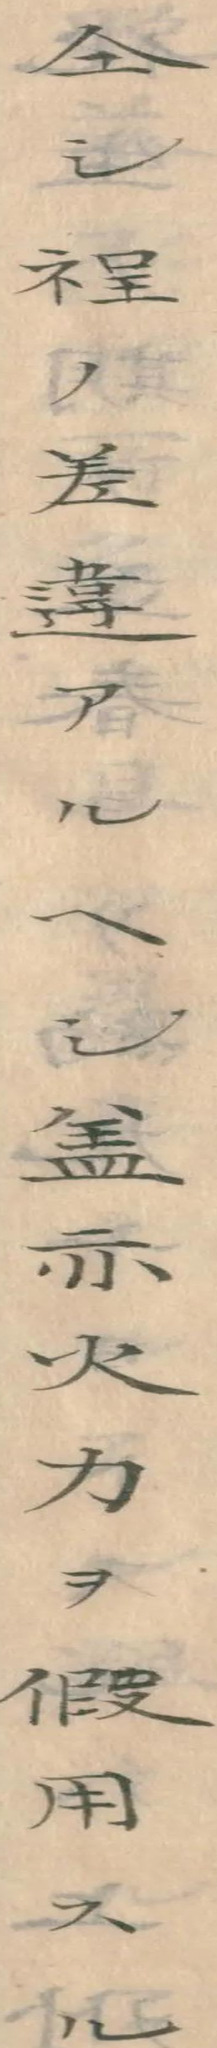仝シ程ノ差違アルヘシ蓋亦火力ヲ仮用スル
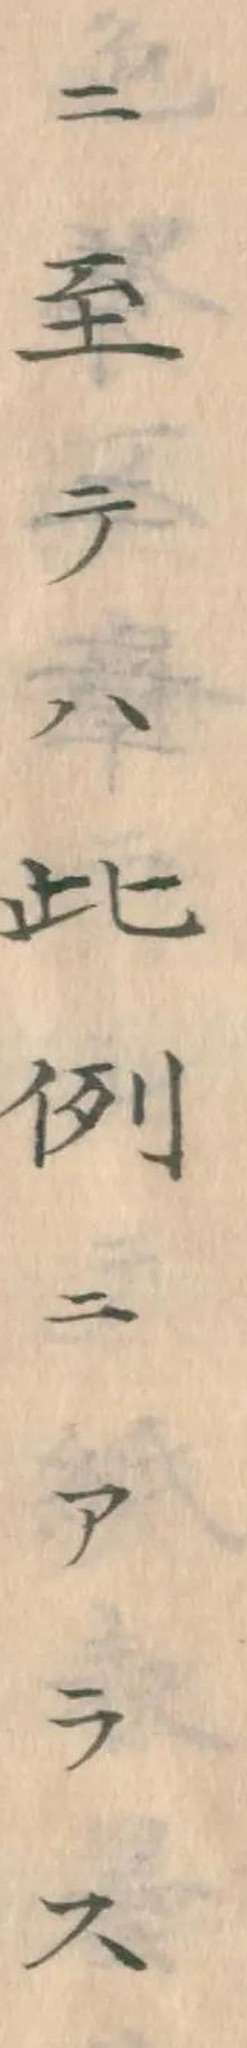ニ至テハ此例ニアラス
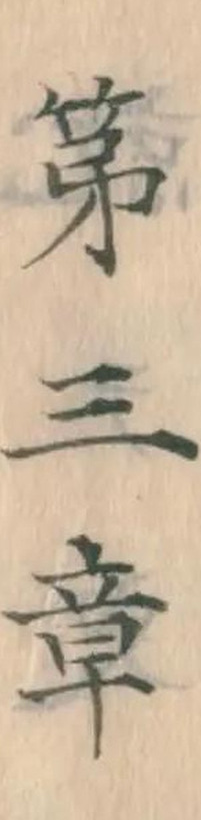第三章
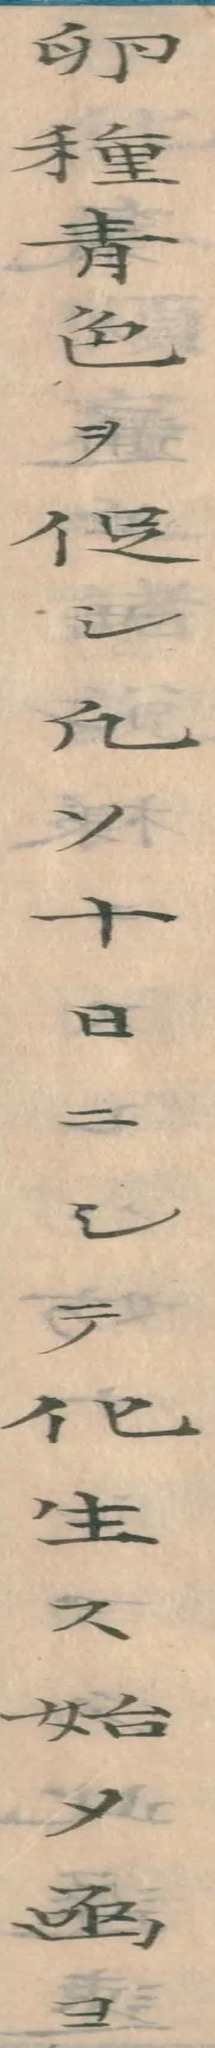卵種青色ヲ促シ凡ソ十日ニシテ化生ス始メ凾ヨ
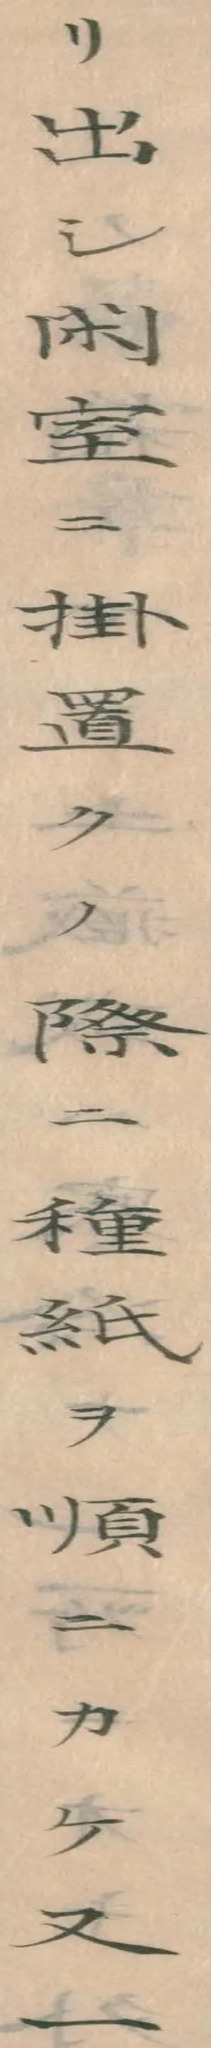リ出シ閑室ニ掛置クノ際ニ種紙ヲ順ニカケ又一
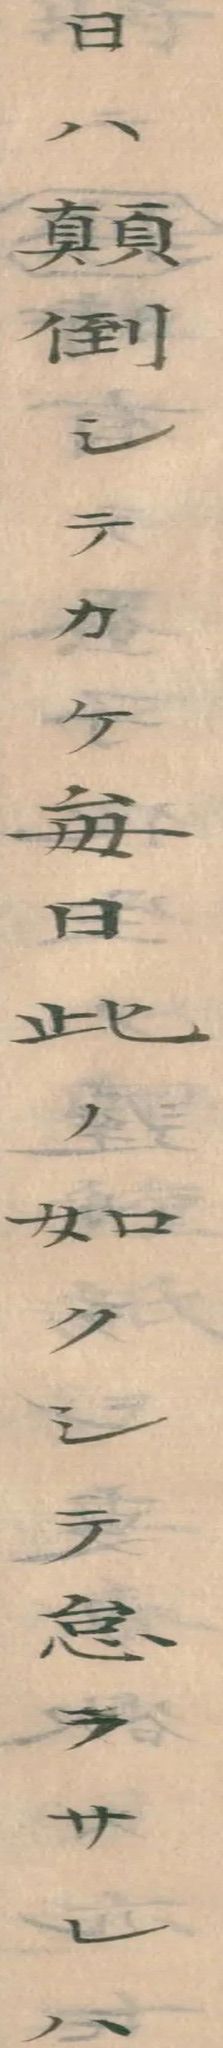日ハ顛倒シテカケ毎日此ノ如クシテ怠ラサレハ
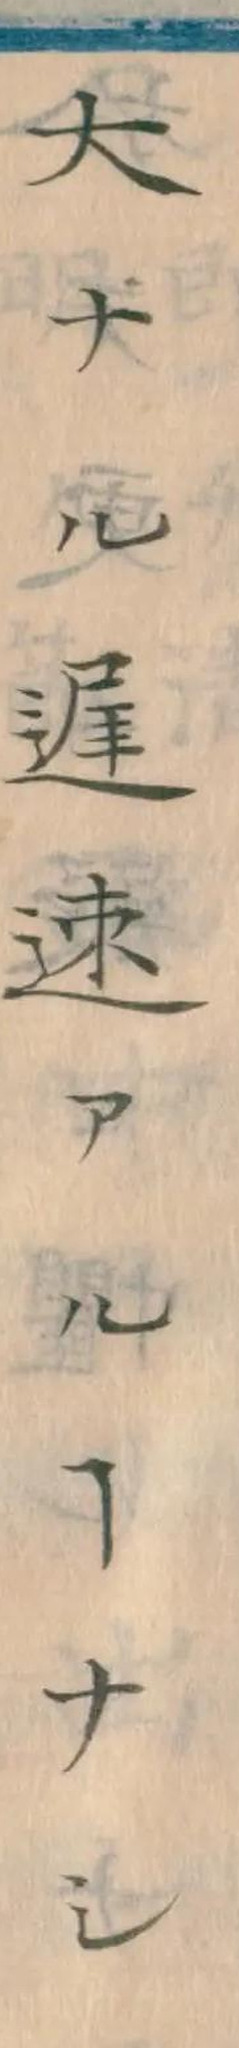大ナル遅速アルコトナシ
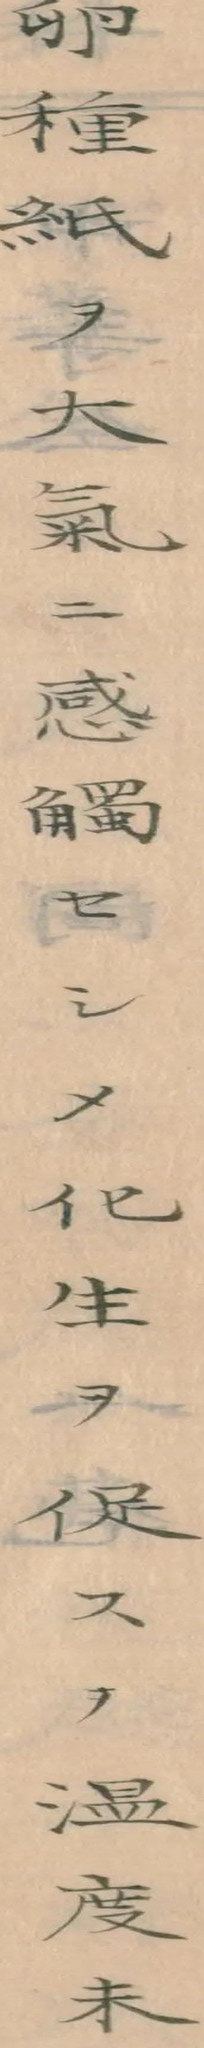卵種紙ヲ大気ニ感触セシメ化生ヲ促スノ温度未
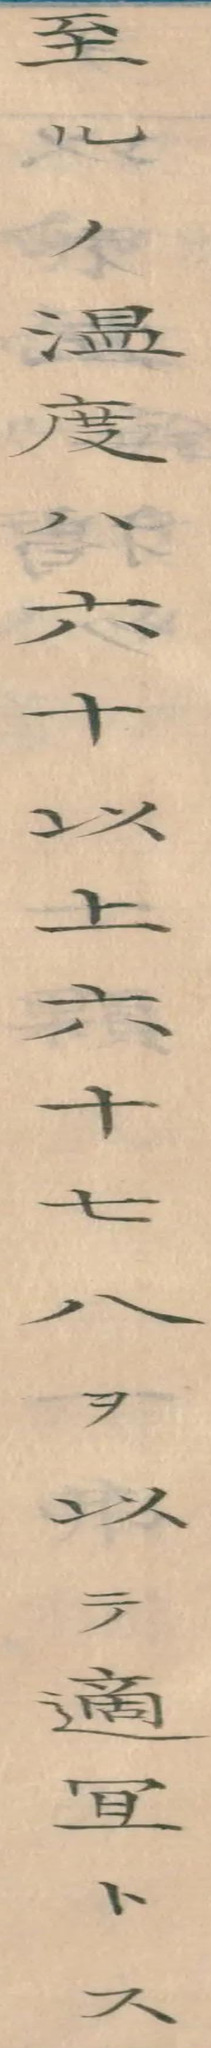至ルノ温度ハ六十以上六十七八ヲ以テ適宜トス
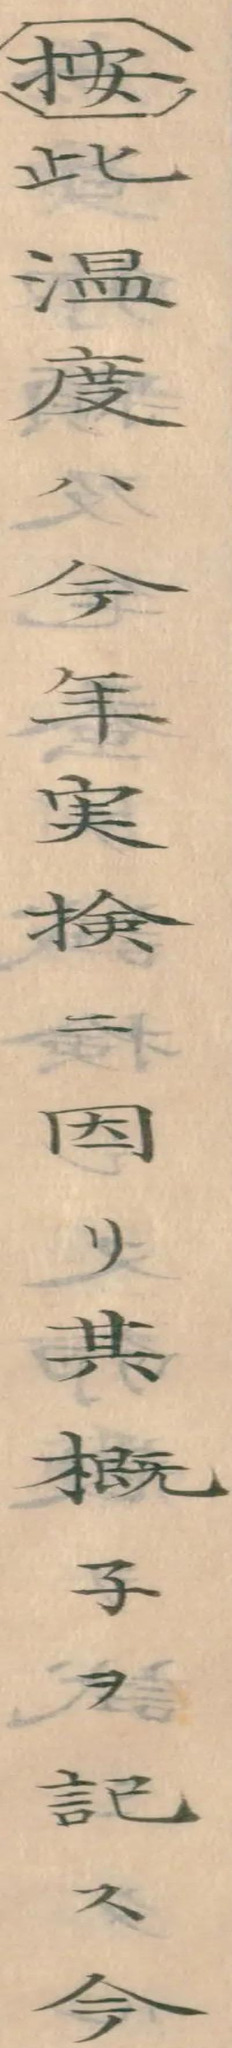[按]此温度ハ今年実𢮦ニ因リ其概ネヲ記ス今
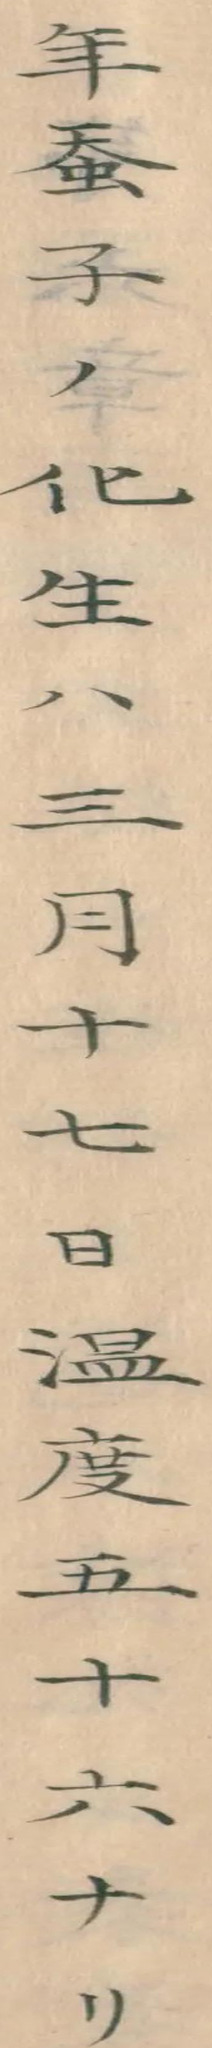年蚕子ノ化生ハ三月十七日温度五十六ナリ
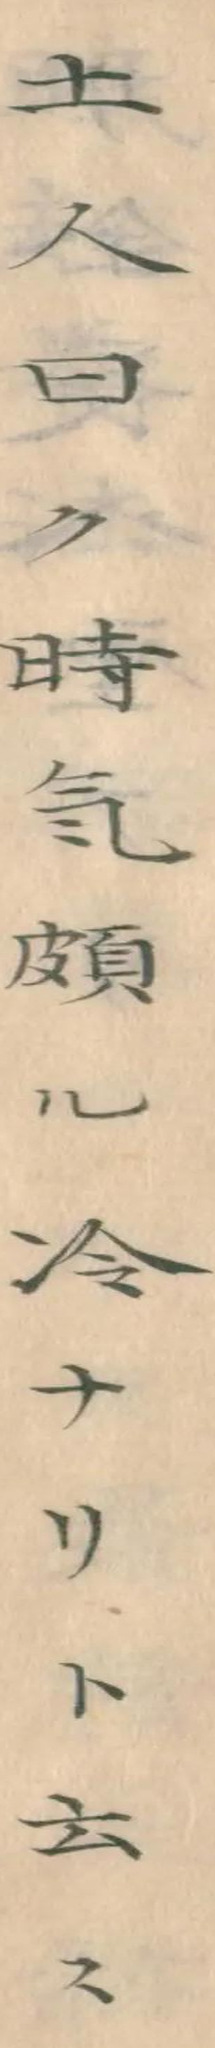土人曰ク時気頗ル冷ナリト云々
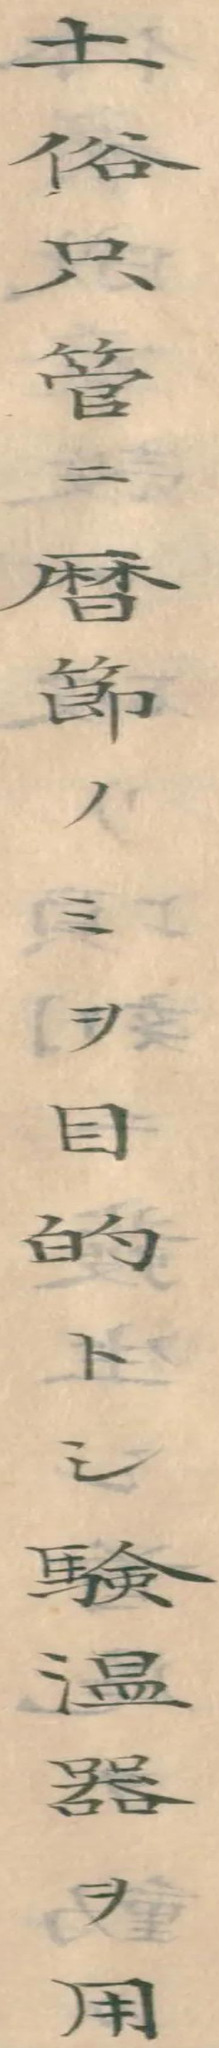土俗只管ニ暦節ノミヲ目的トシ験温器ヲ用
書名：蚕桑集成
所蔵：国立国会図書館 National Diet Library, JAPAN
